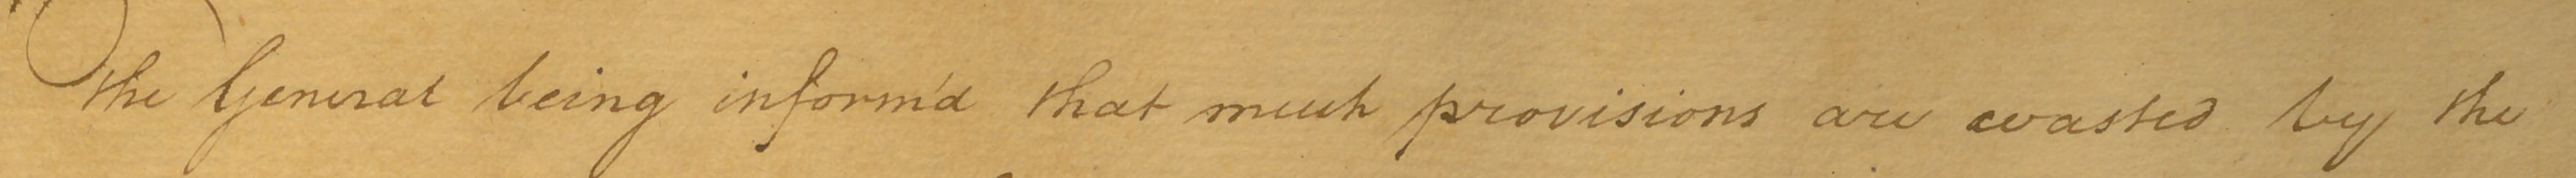The General being inform'd that much provisions are wasted by the
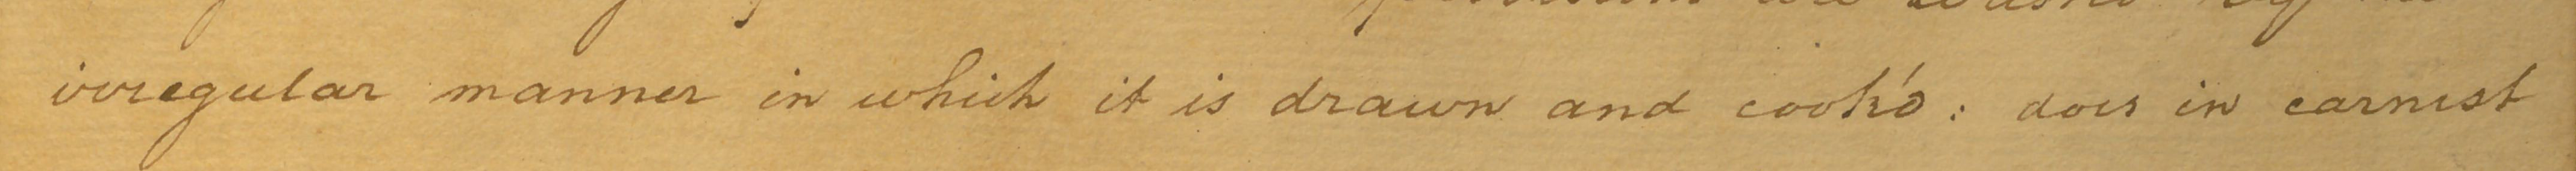irregular manner in which it is drawn and cook'd: does in earnest
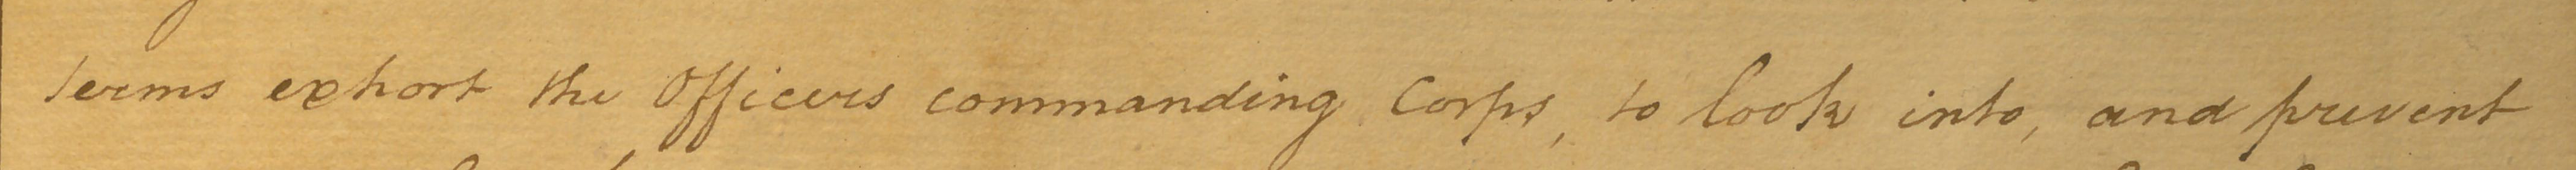terms exhort the Officers commanding Corps, to look into, and prevent
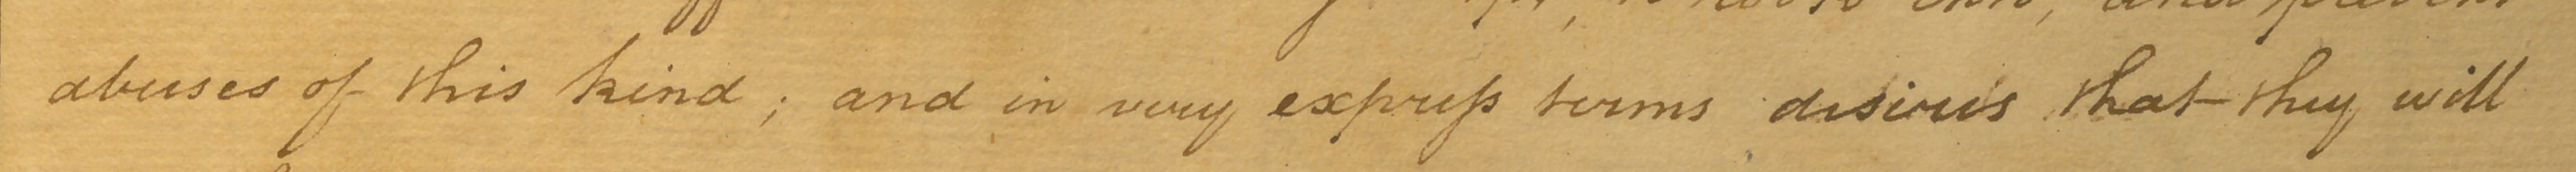abuses of this kind; and in very express terms desires that they will
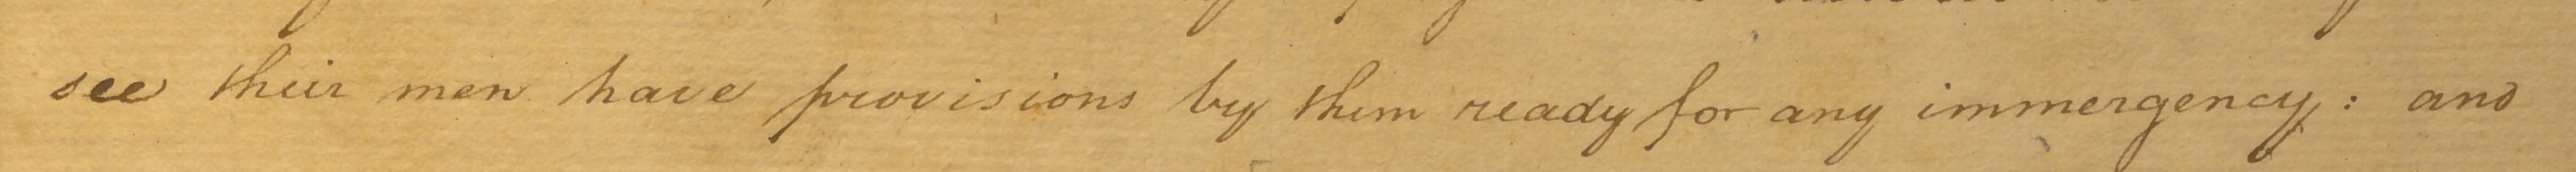see their men have provisions by them ready for any immergency: and
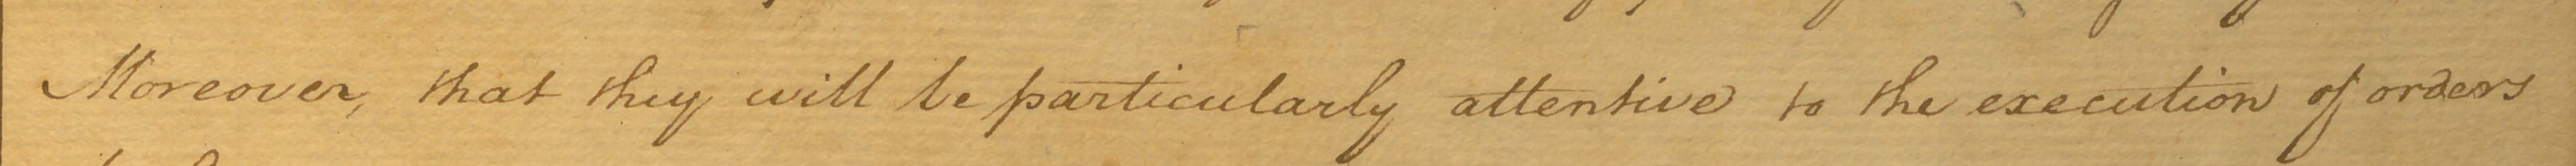Moreover, that they will be particularly attentive to the execution of orders
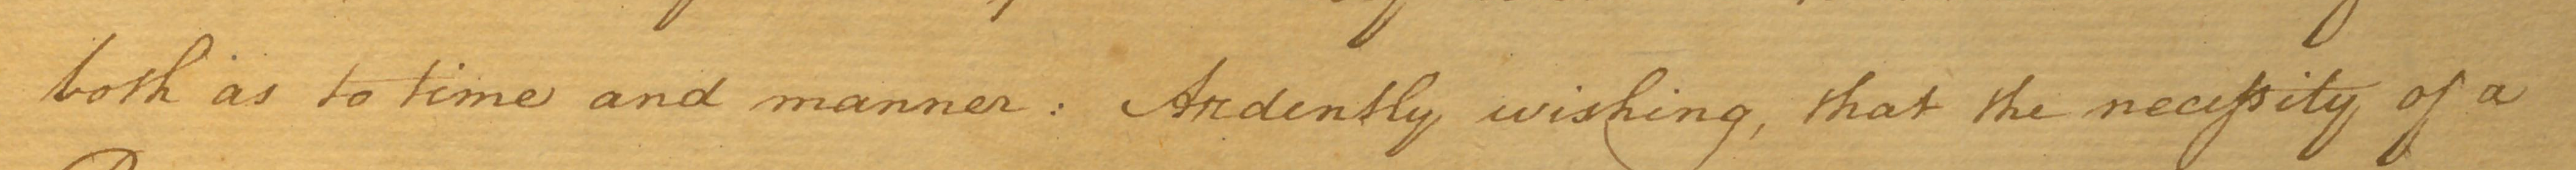both as to time and manner: Ardently wishing that the necessity of a
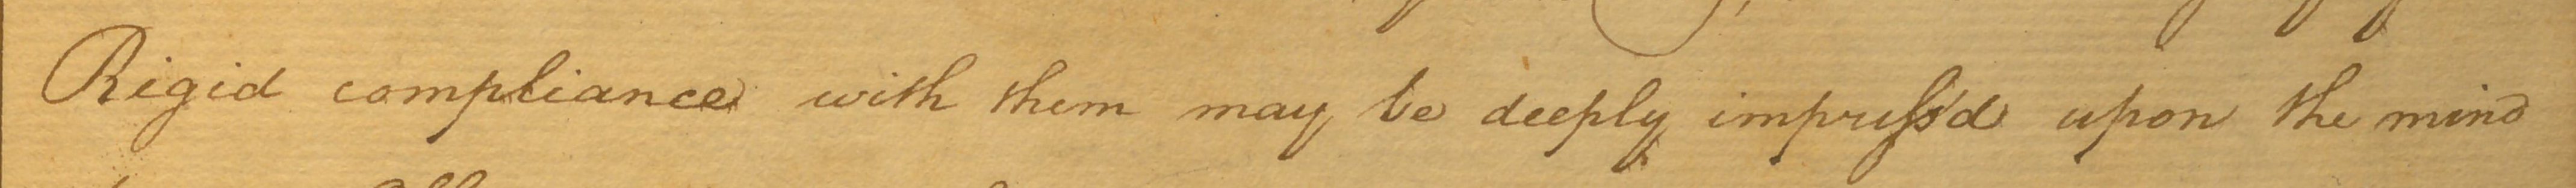Rigid compliance with them may be deeply impress'd upon the mind
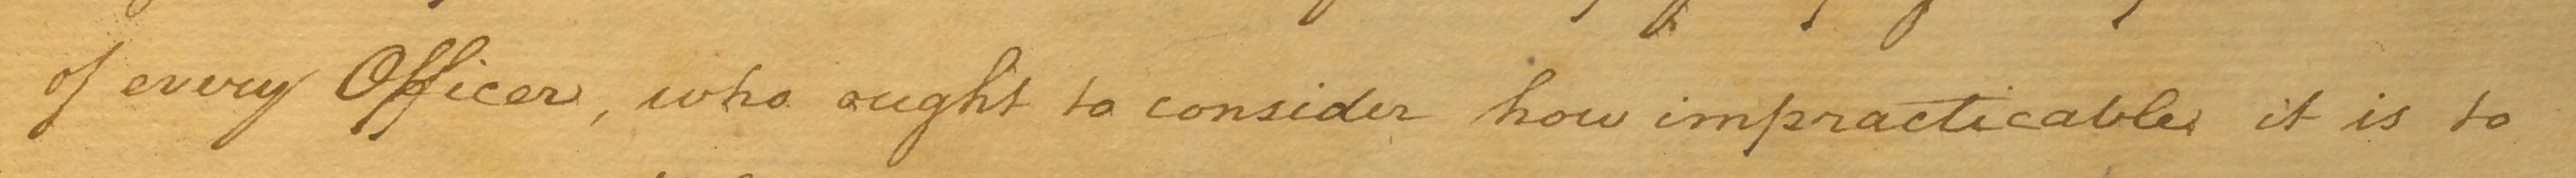of every Officer, who ought to consider how impracticable it is to
